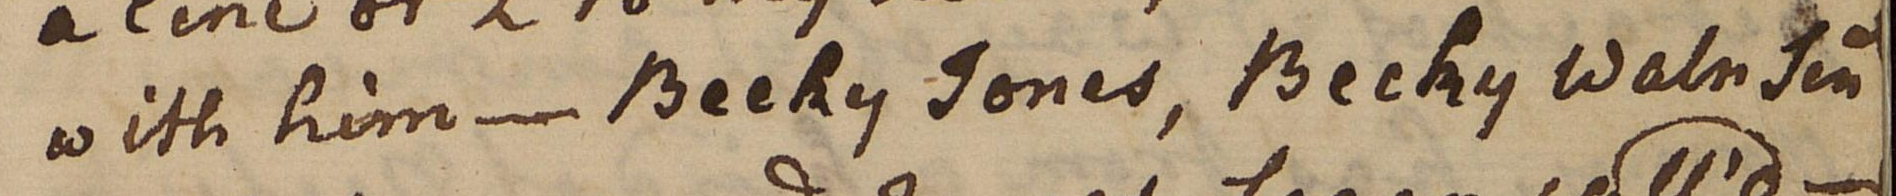with him- Becky Jones, Becky Waln Sen^r
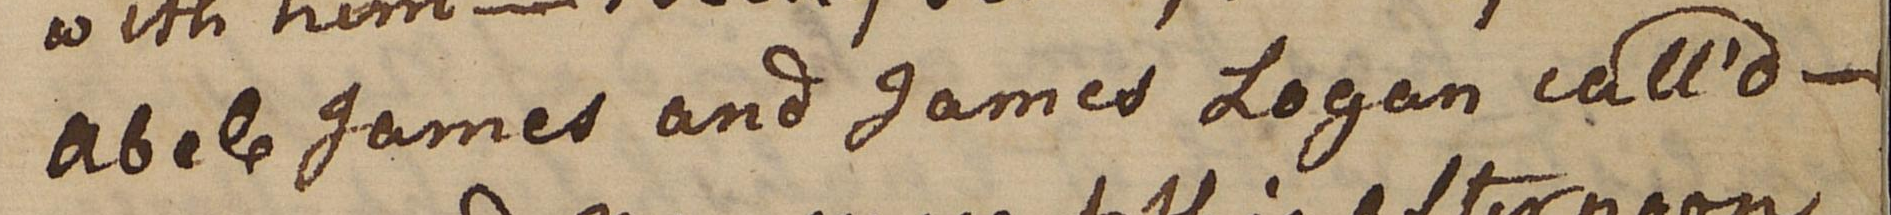Abel James and James Logan call'd-
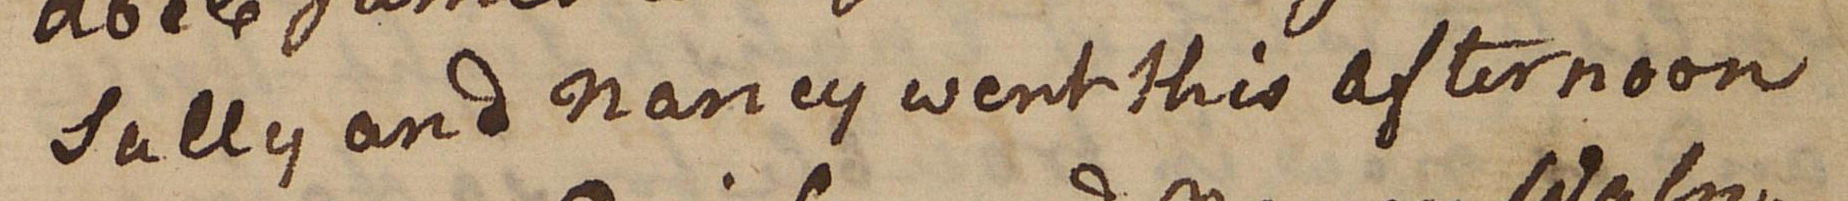Sally and Nancy went this afternoon
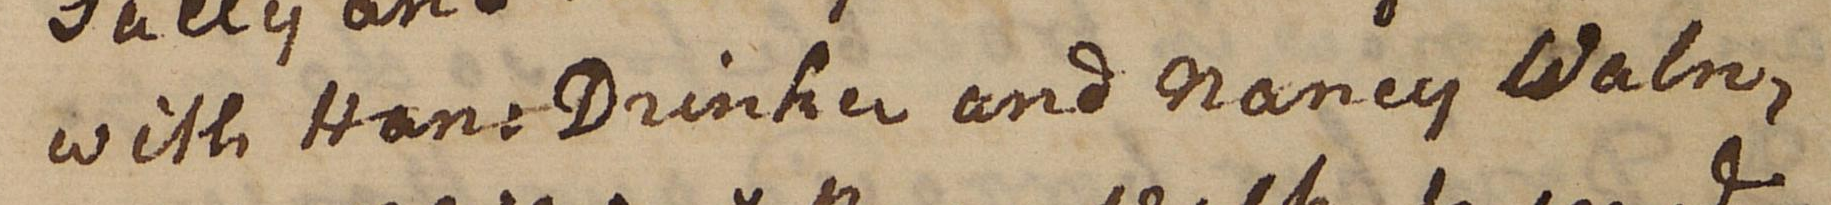with Han: Drinker and Nancy Waln,
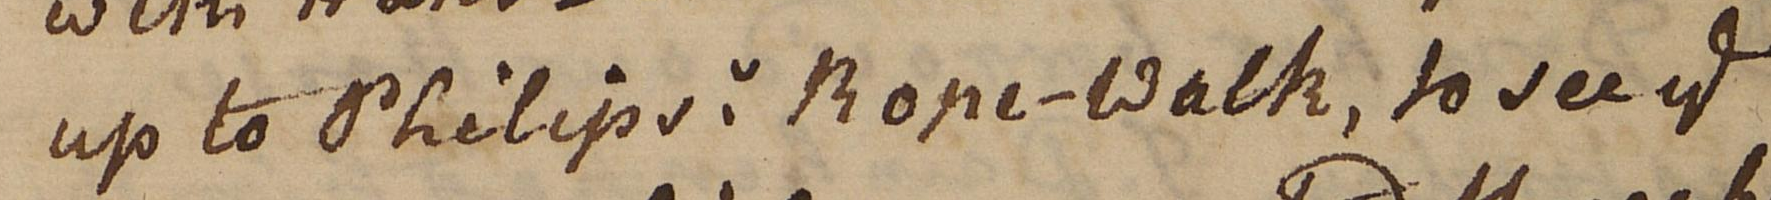up to Philips^s. Rope-Walk, to see y^e
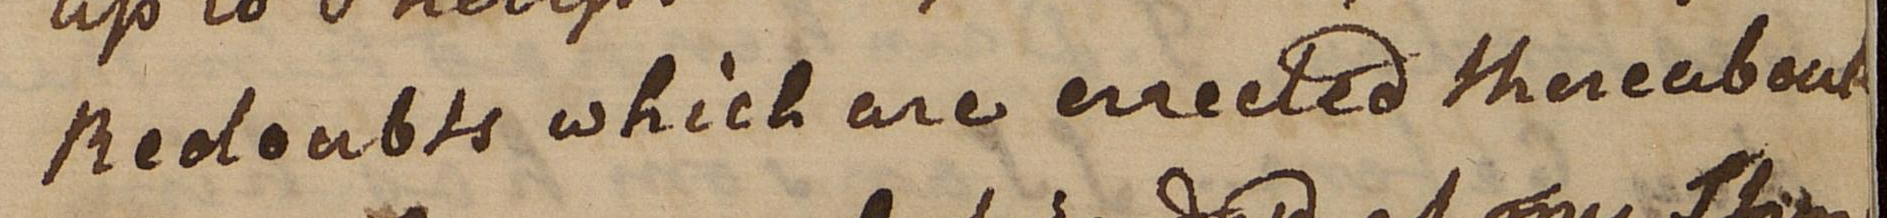Redoubts which are errected thereabout
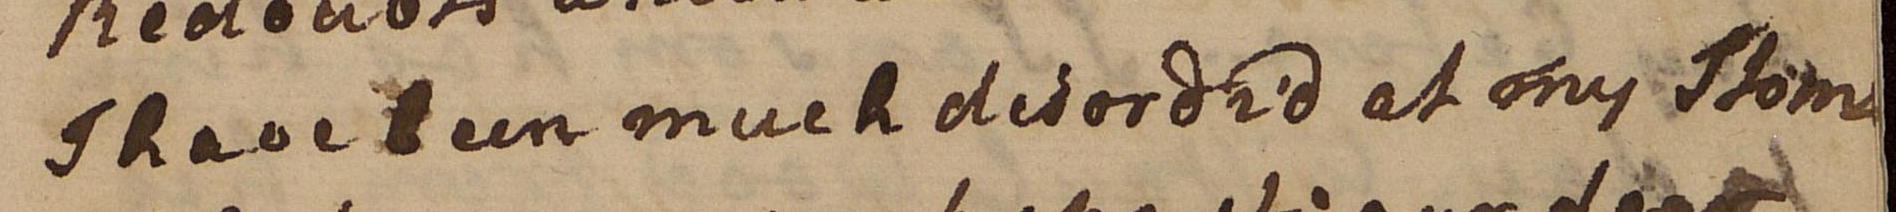I have been much dirodr'd at my Stom-
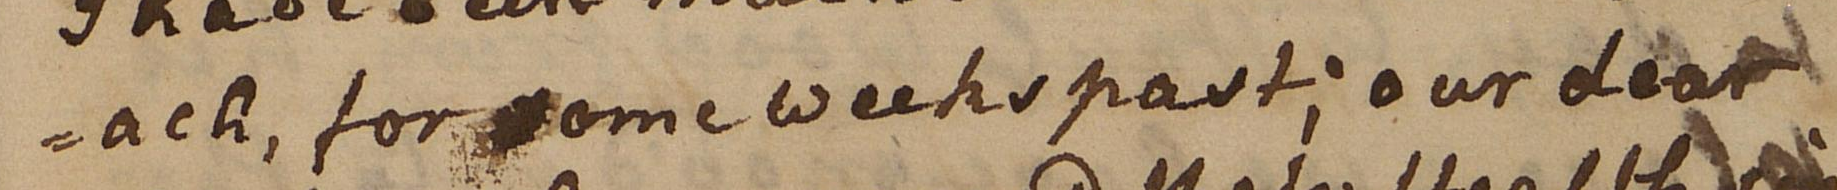-ach, for some weeks past; our dear
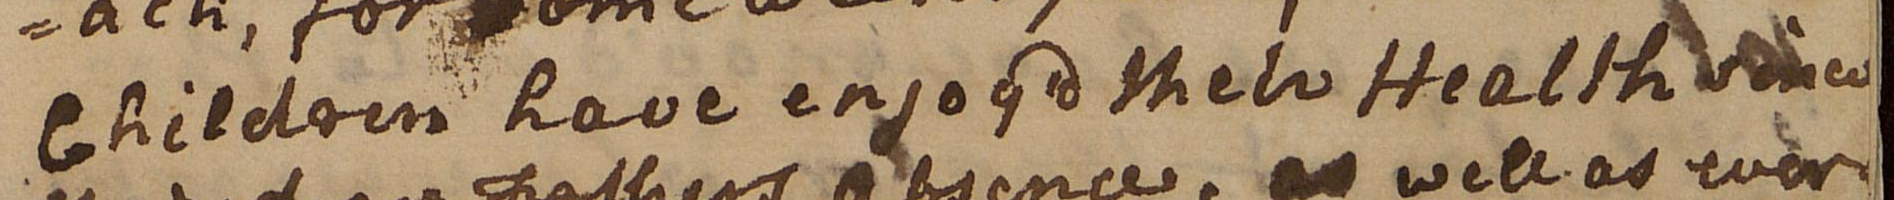Childrens have enjoy'd their Health since
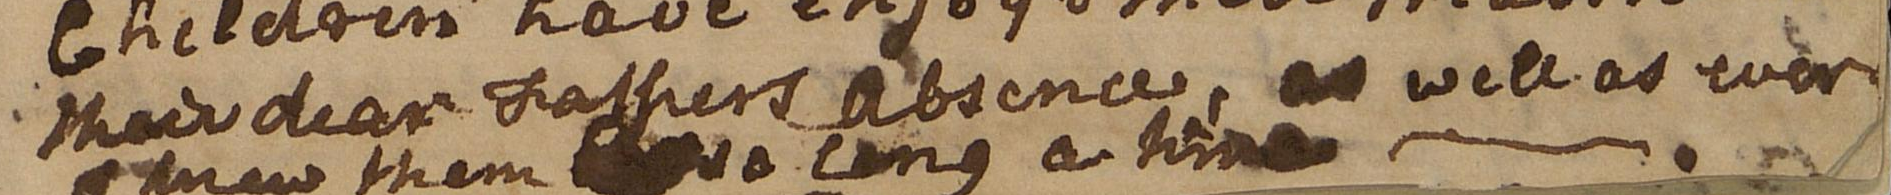their dear Fathers Absence, as well as ever
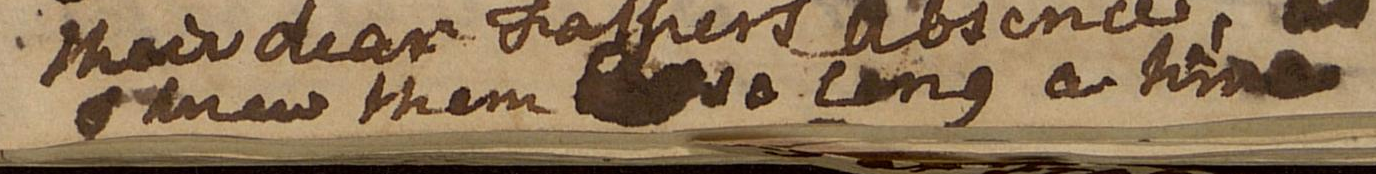I knew them [___]s long a time
